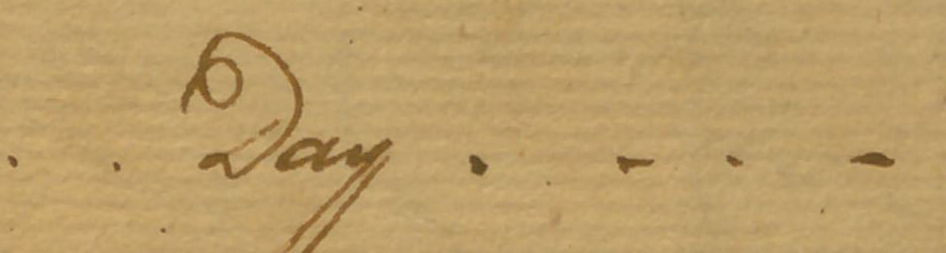Day ....
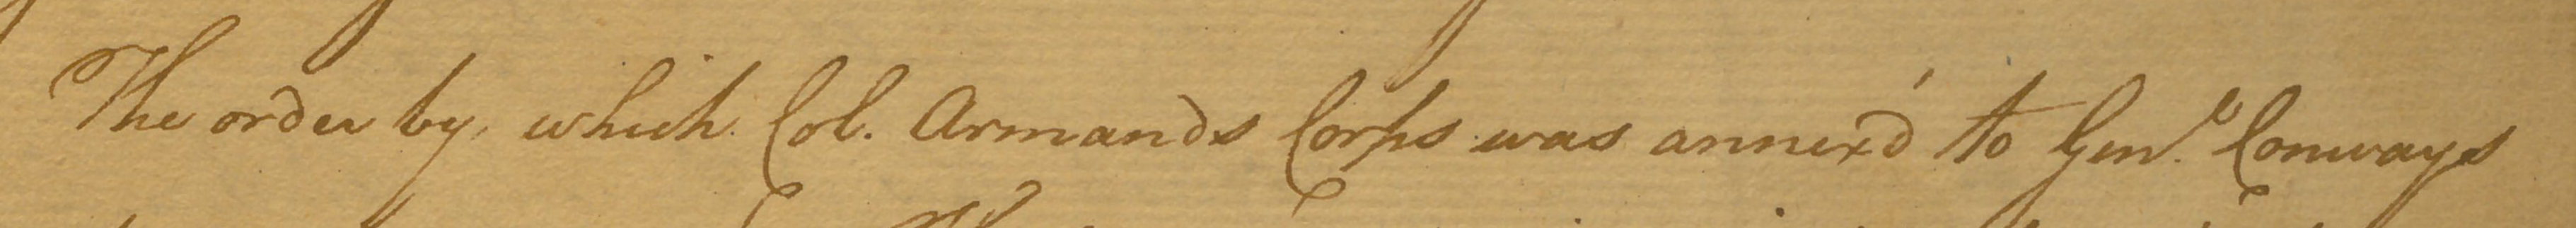The order by which Col. Armands Corps was annexd to Gen^l. Conways
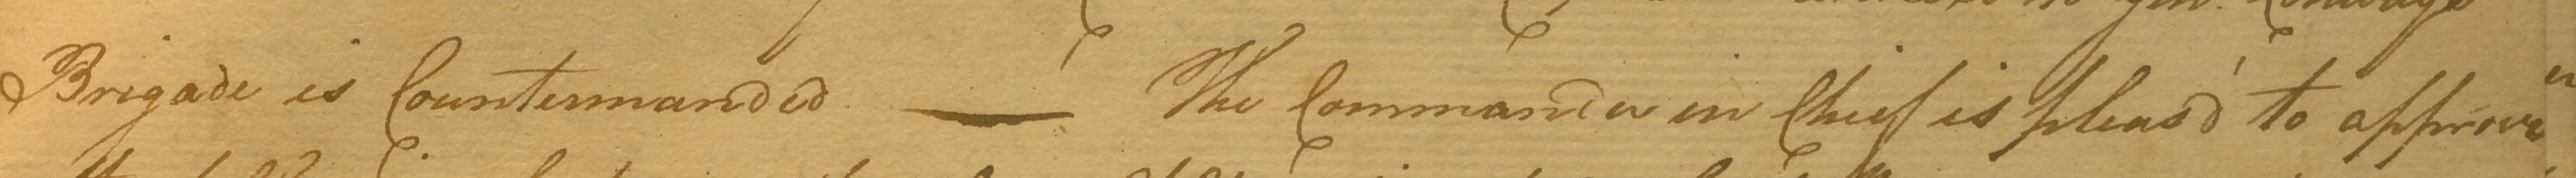Brigade is Countermanded- The Commander in Chief is pleas'd to approve
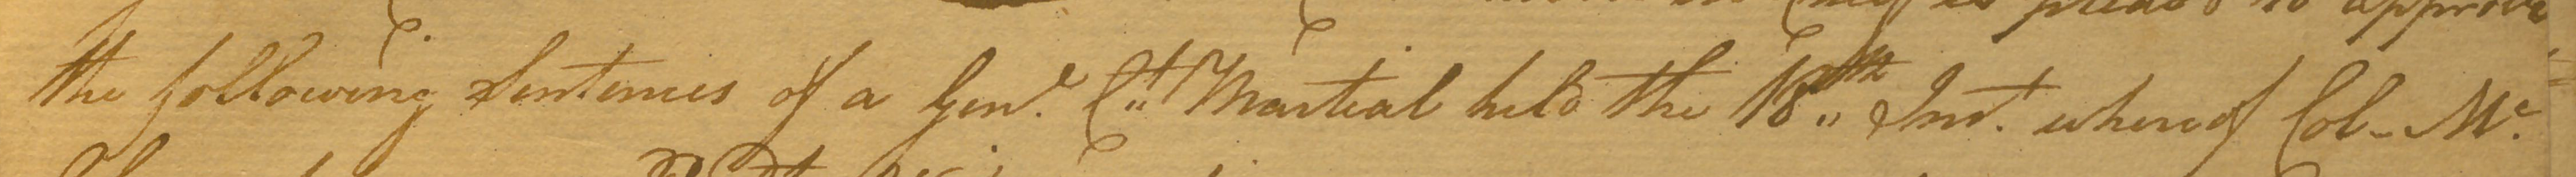the following Sentences of a Gen^l. C^t. Martial held the 18^th. Ins^t. whereof Col. M^c.
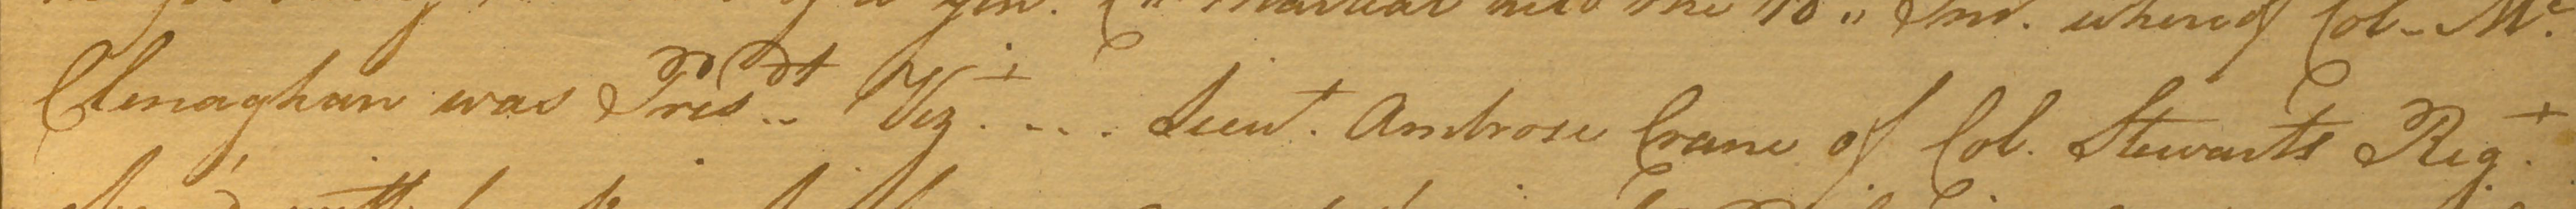Clenaghan was Pres^dt. Viz^t. ... Lieut Ambrose Crane of Col. Stewarts Reg^t.
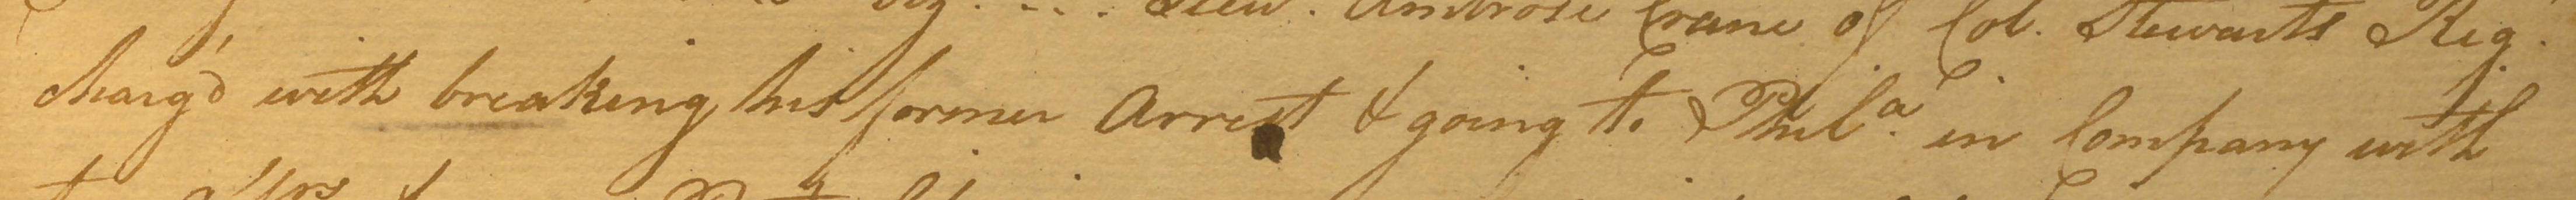chargd with breaking his former Arrest & going to Phil^a. in Company with
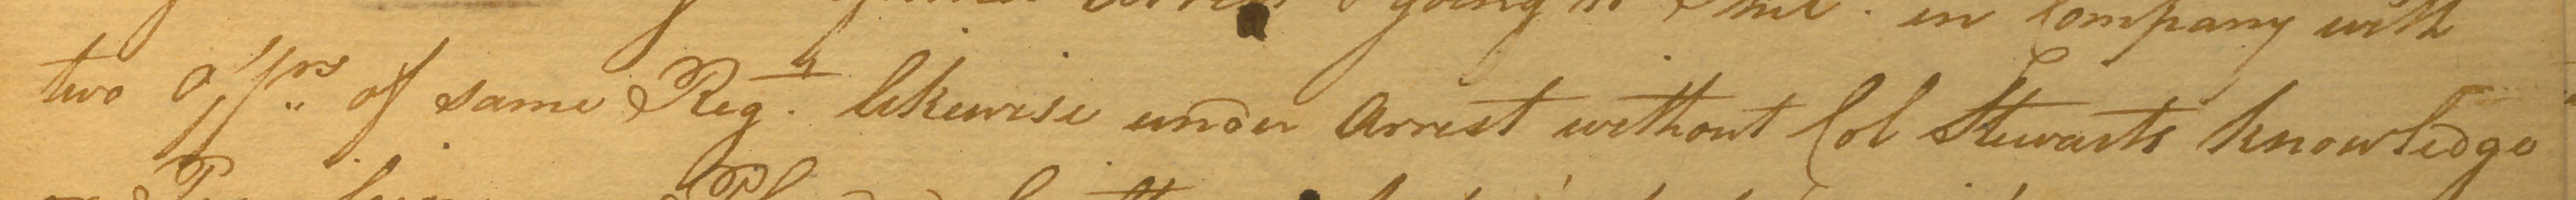two off^rs. of same Reg^t. likewise under Arrest without Col Stewarts knowledge
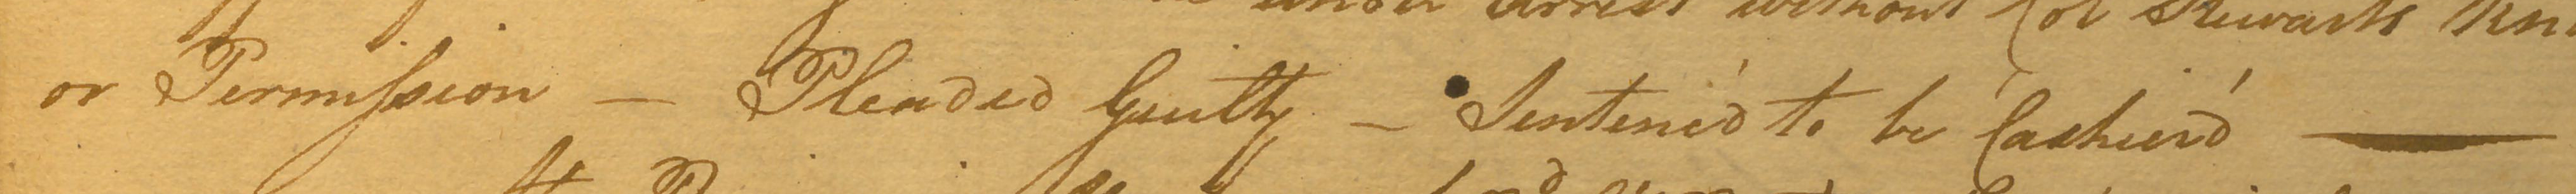or Permission- Pleaded Guilty- Sentenced to be Cashier'd-
